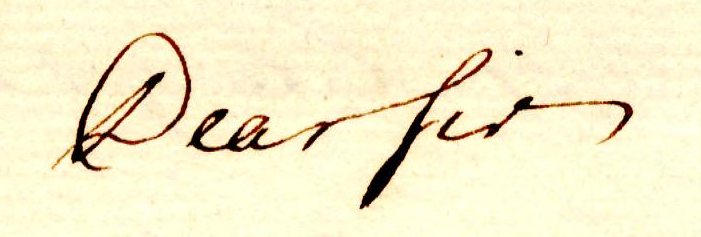Dear Sir
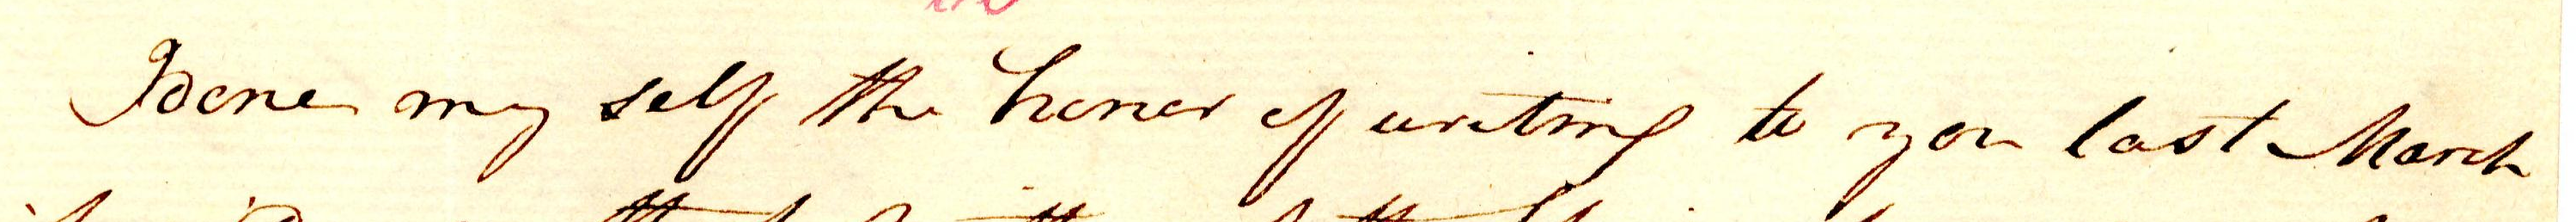I dene my self the honor of writing to you last March
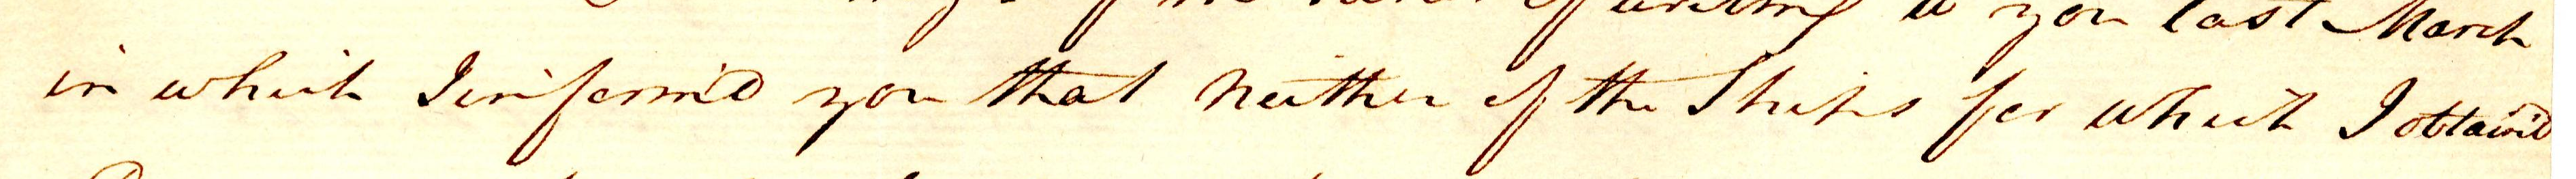in which I inform'd you that neither of the Ships for which I obtain'd
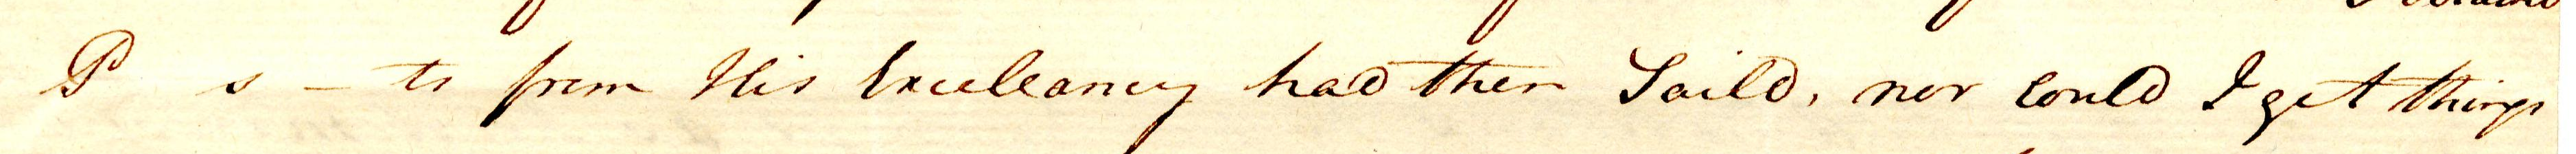P s ts from His Excellancy had then saild, nor could I get things
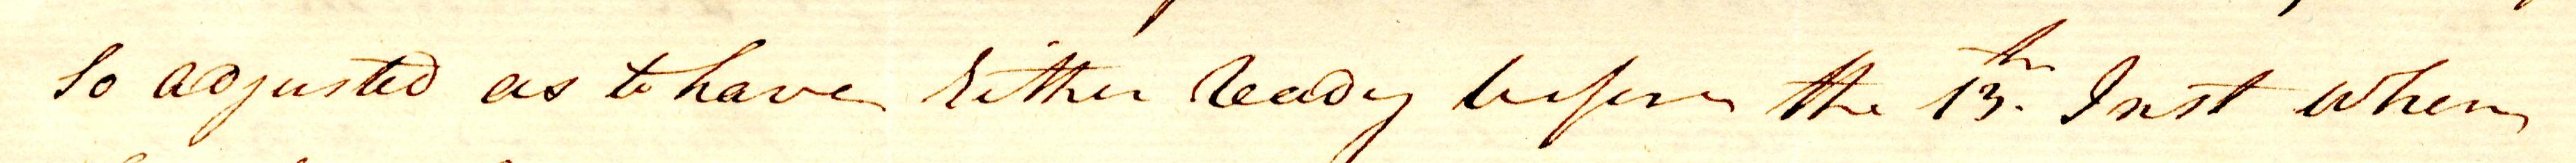so adjusted as to have Either ready before the 13^th Inst when
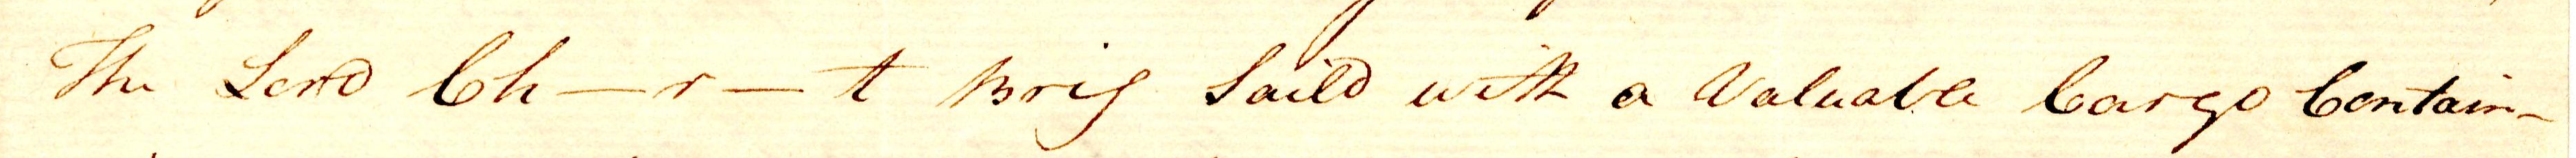The Lord Ch-r-t Brig saild with a Valuable Cargo Contain-
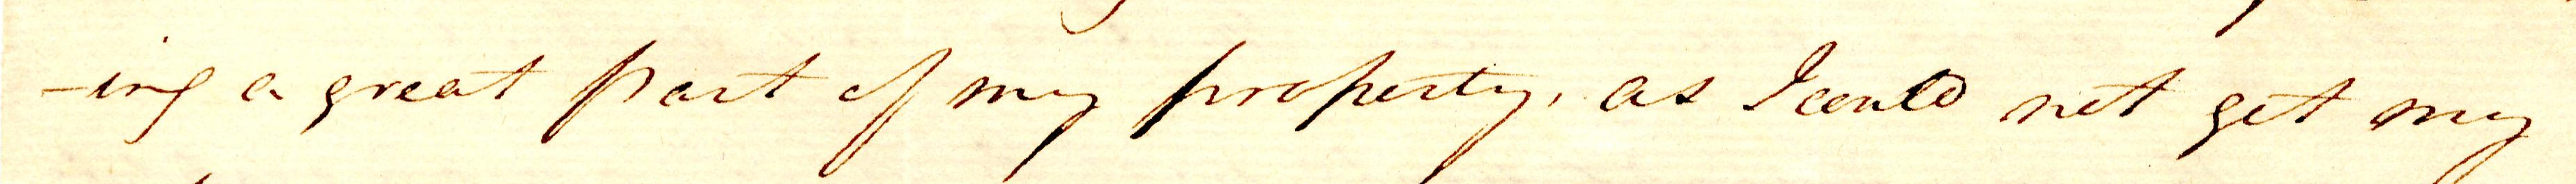-ing a great part of my property, as I could not get my
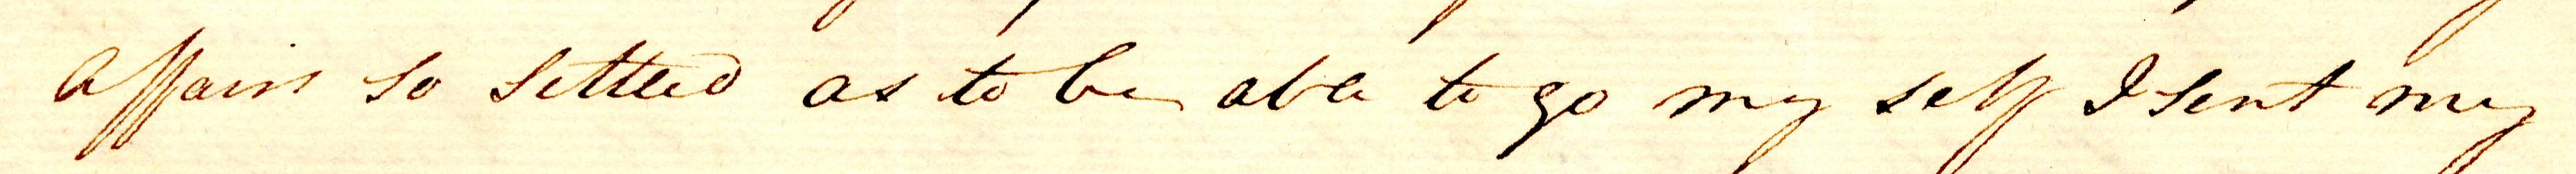Affairs so settled as to be able to go my self I sent my
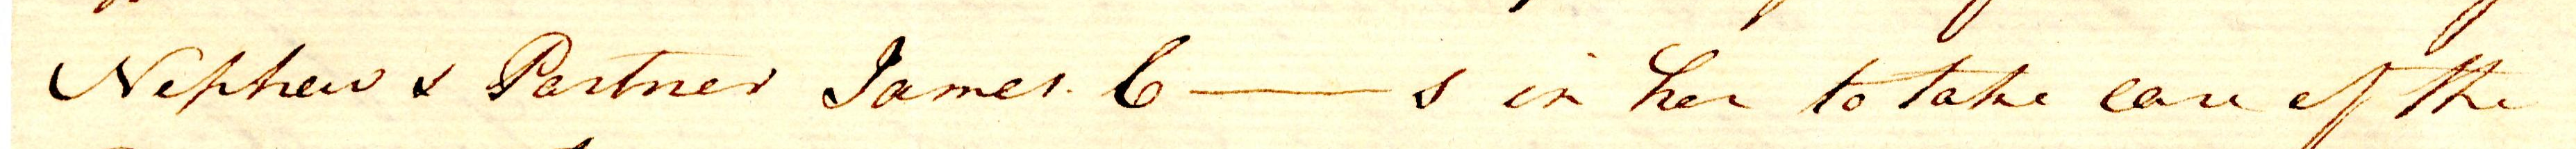Newpher & Partner James C-s in her to take care of the
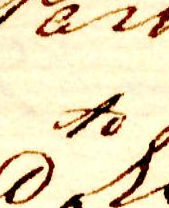to
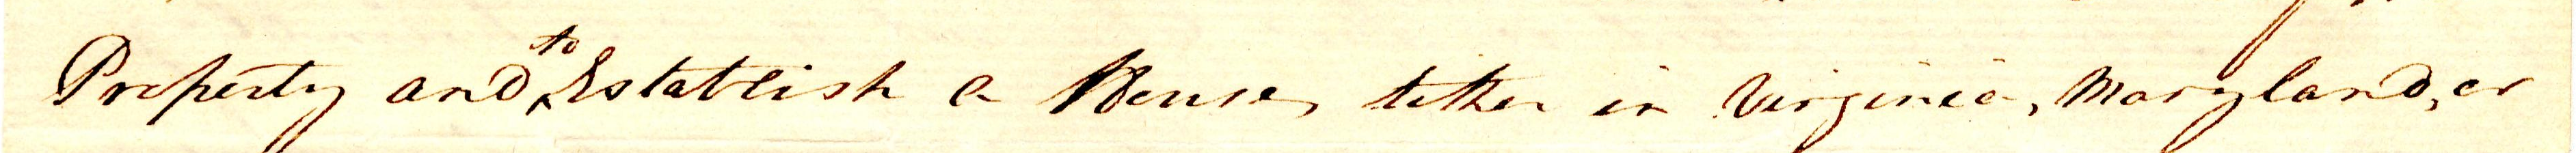Property and ^ Establish a House, either in Virginia, Maryland, or
